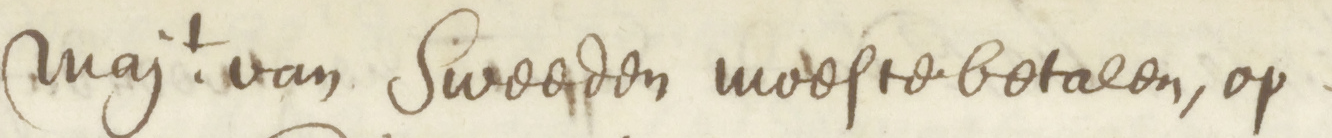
majt van Sweeden moeste betalen, op
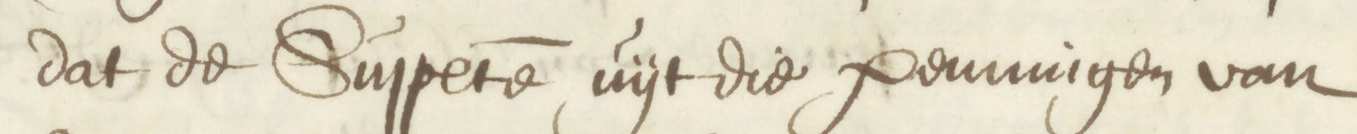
dat de Supplte uijt die pennigen van
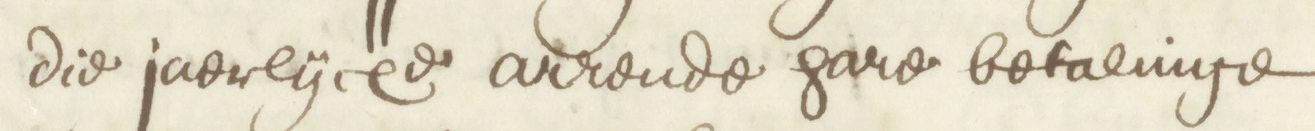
die jaerlijcxe arrende hare betalinge
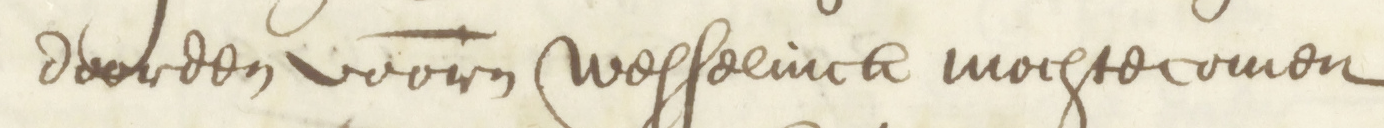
doorden voorn Wesselinck mochte comen
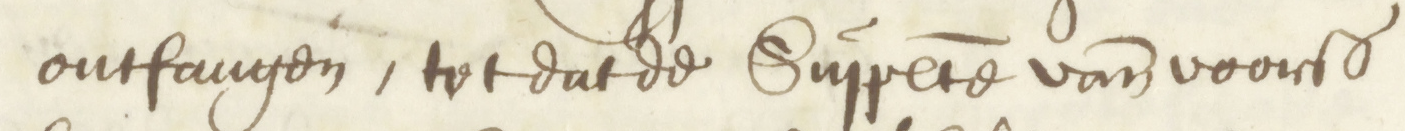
ontfangen, tot dat de Supplte van voorsz
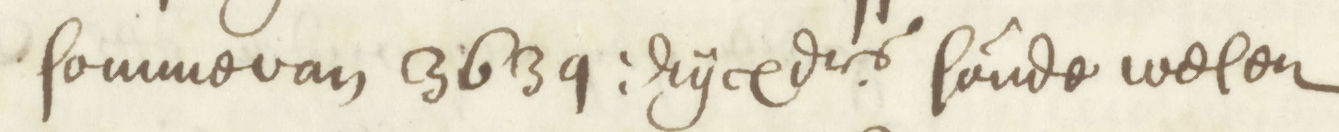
somme van 3639. rijcxdrs soude wesen
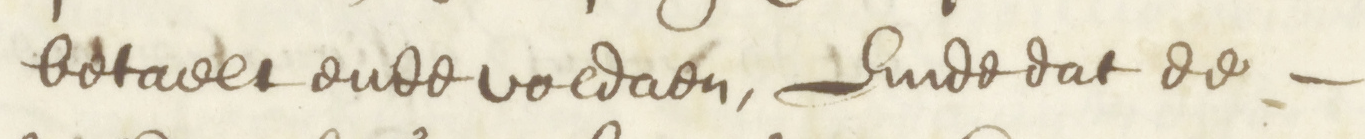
betaelt ende voldaen, Ende dat de —
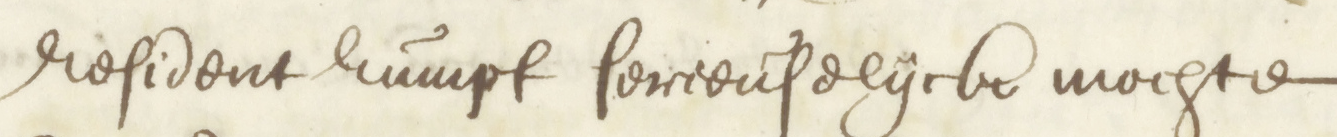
resident rumpf serieuselijck mochte
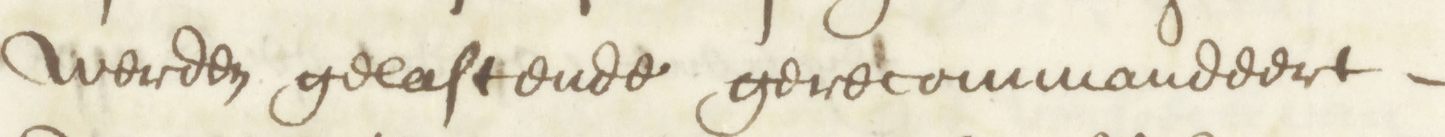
worden gelast ende gerecommandeert
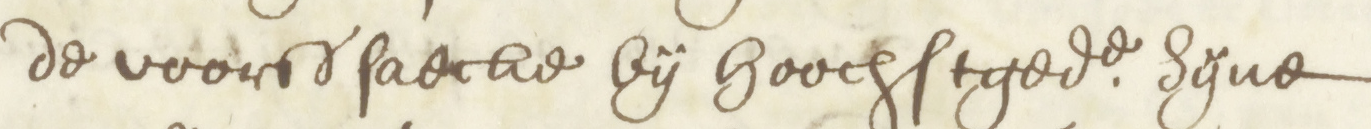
de voorsz saecke bij hoochstgede sijne
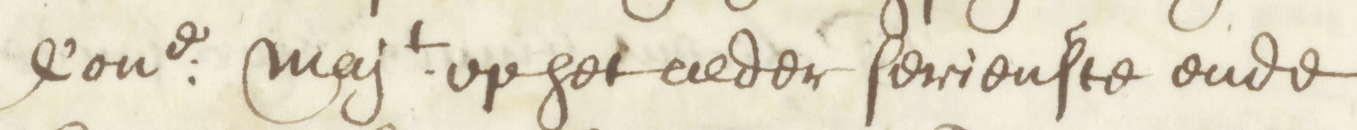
Cone. Majt. op het alder serieuste ende
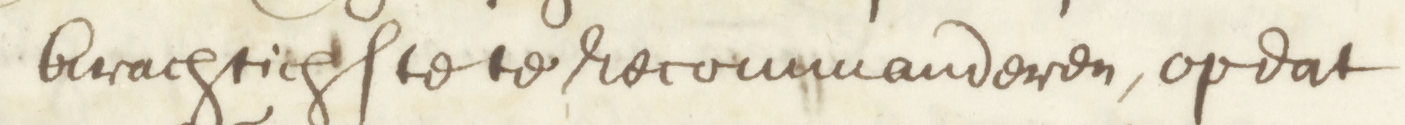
krachtichste te recommanderen, opdat
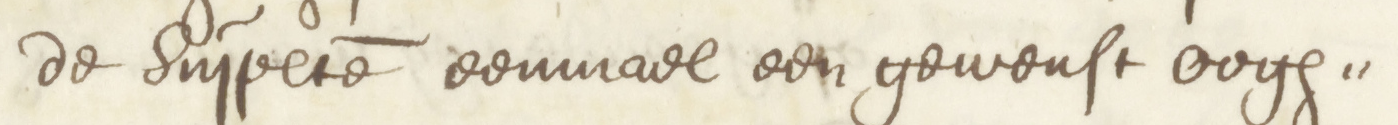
de supplte eenmael een gewenst oogh,,
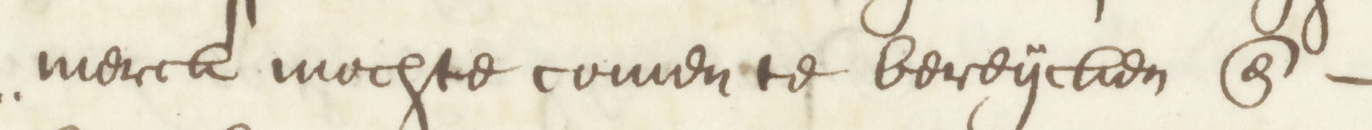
merck mochte comen te bereijcken & —
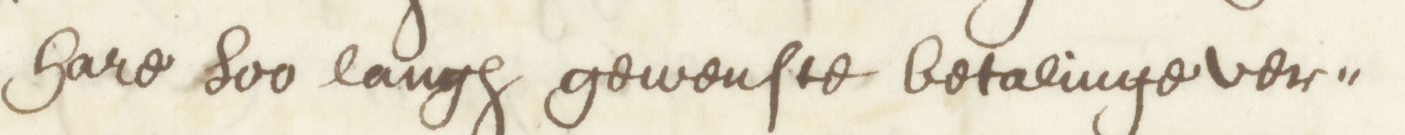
hare soo langh gewenste betalinge ver,,
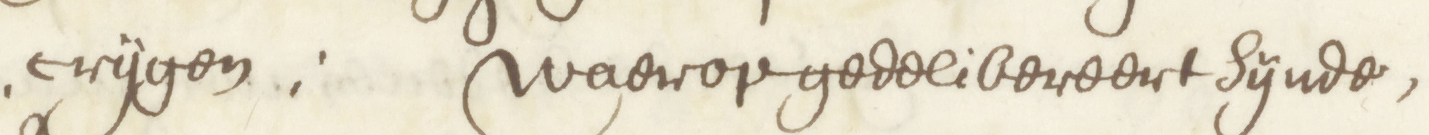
crijgen: Waerop gedelibereert sijnde,
